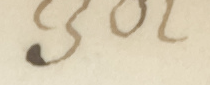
301
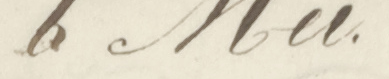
6 Mei.
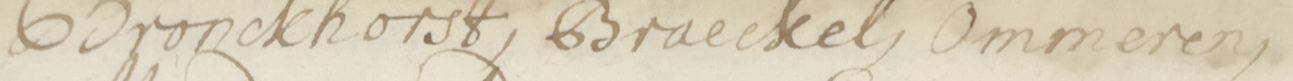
Bronckhorst, Braeckel, Ommeren,
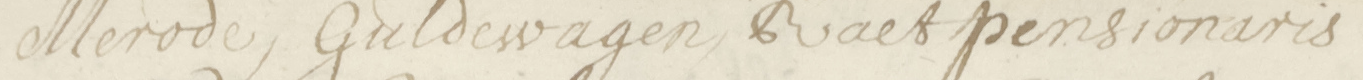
Merode, Guldewagen, Raet pensionaris
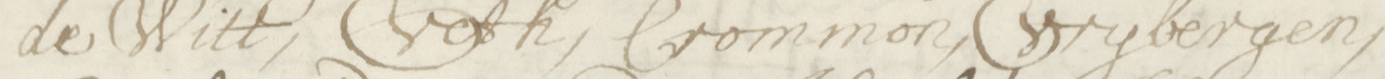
de Witt, Veth, Crommon, Vrijbergen,
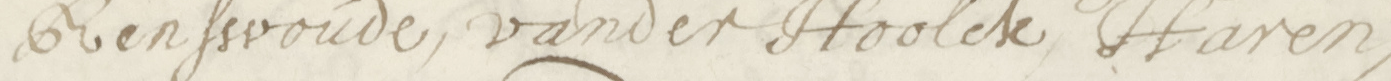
Renswoude, vander Hoolck, Haren.
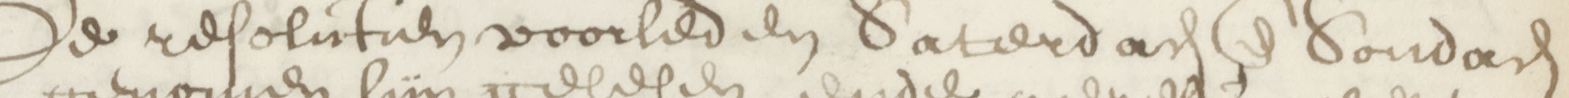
De resolutien voorleden Saterdach & Sondach
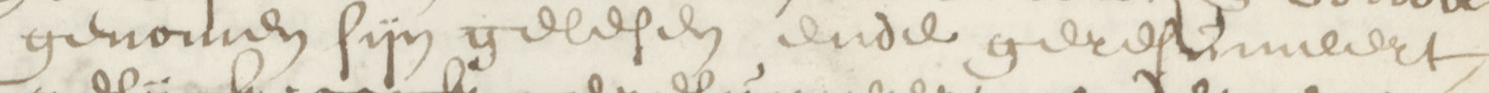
genomen sijn gelesen ende geresumeert,
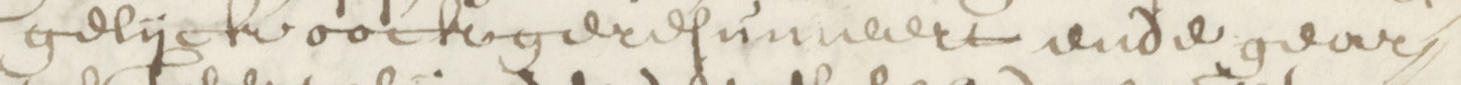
gelijck oock geresumeert ende gear,,
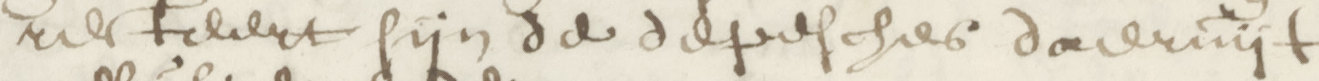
resteert sijn de depesches daeruijt
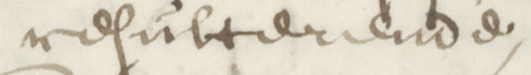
resulterende.
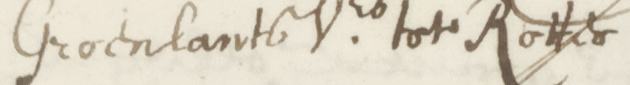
GroenlantsVrs. tot Rotter
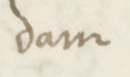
dam
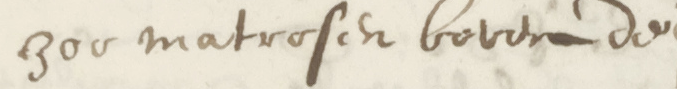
300 matrosen boven de
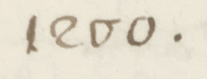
1200.
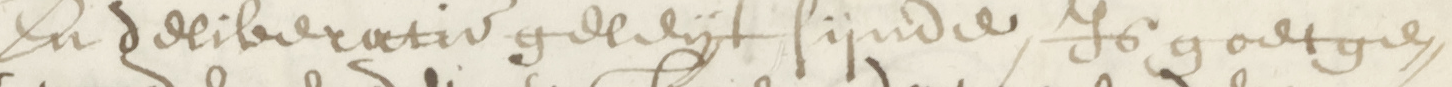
In deliberatie geleijt sijnde, Is goetge,,
